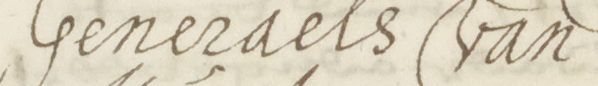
Generaels van
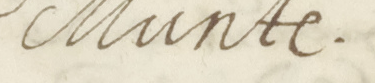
Munte.
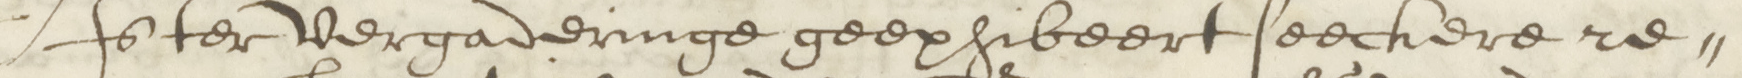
Is ter Vergaderinge geexhibeert seeckere re„
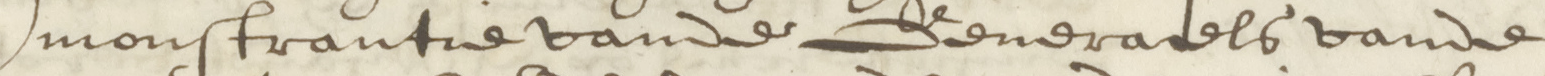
monstrantie vande Generaels vande
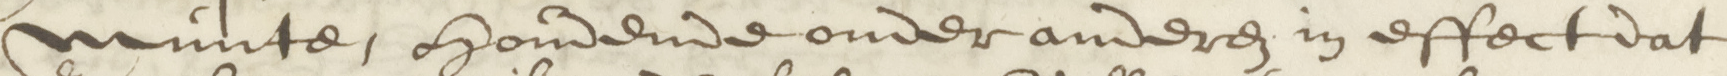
Munte, houdende onder anderen in effect dat
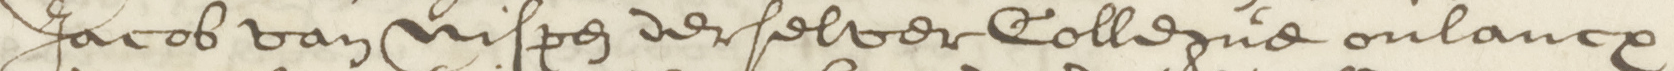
Jacob van Nispen derselver Collegie onlancx
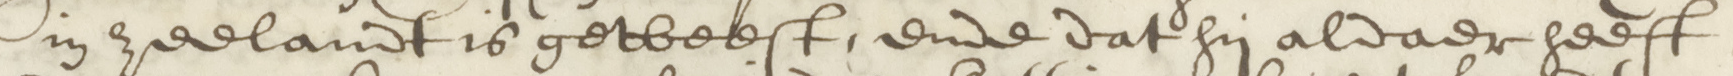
in zeelandt is geweest, ende dat hij aldaer heeft
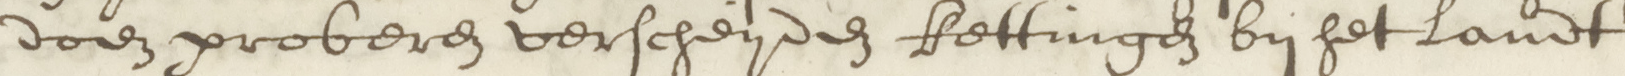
doen proberen verscheijden Rettingen bij het Landt
